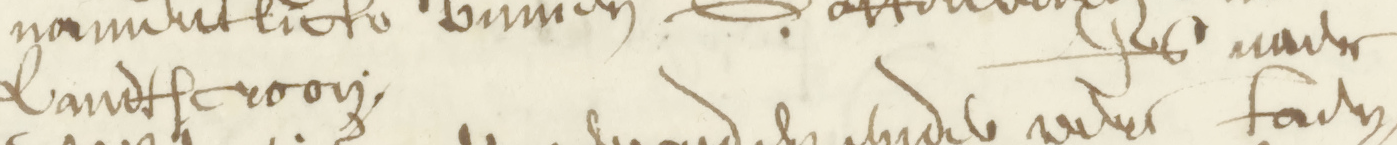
Landtscroon. Is naer
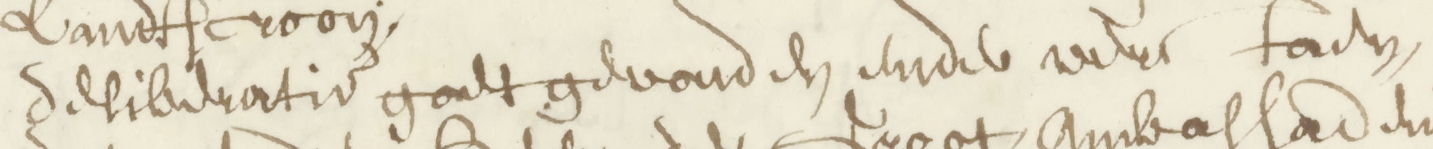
deliberatie goetgevonden ende verstaen,
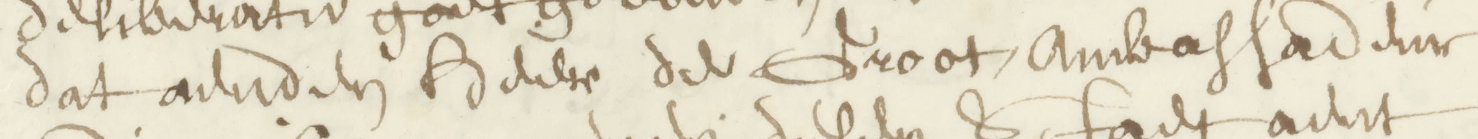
dat aenden Heer de Groot, ambassadeur
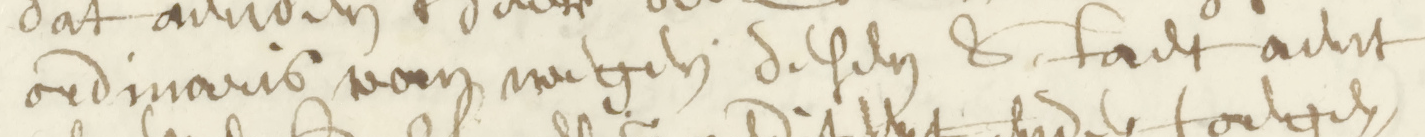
ordinaris van wegen desen Staet aent
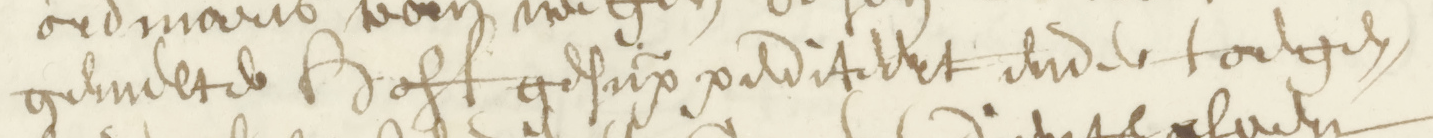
gemelte Hoff gesuppediteert ende toege„
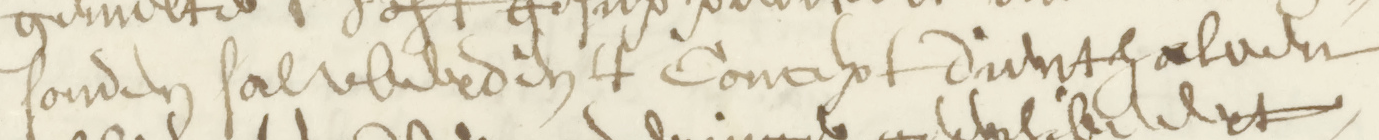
sonden sal werden 't Concept dienthalven
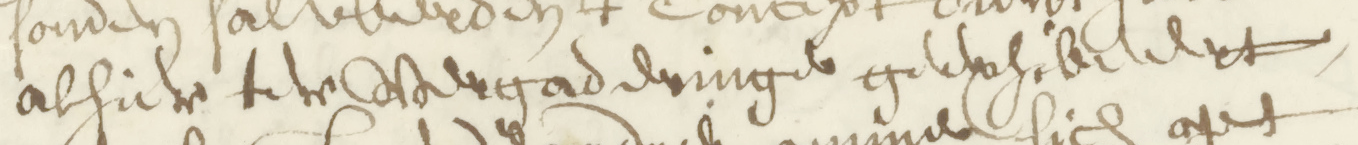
alhier ter Vergaderinge geexhibeert
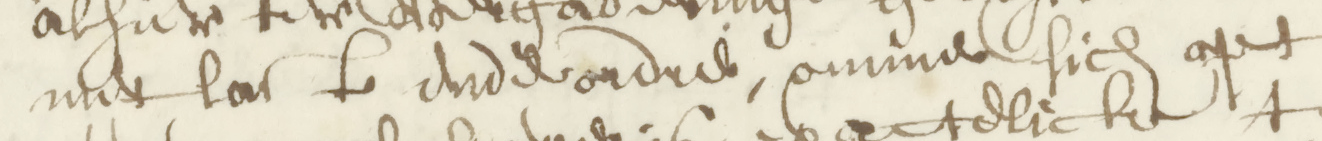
met last ende ordre, omme sich opt
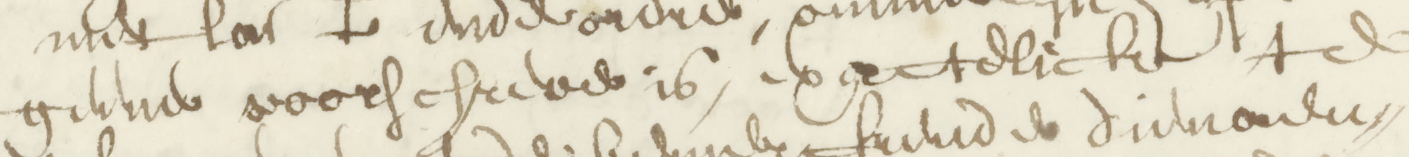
geene voorschreve is, exactelick te
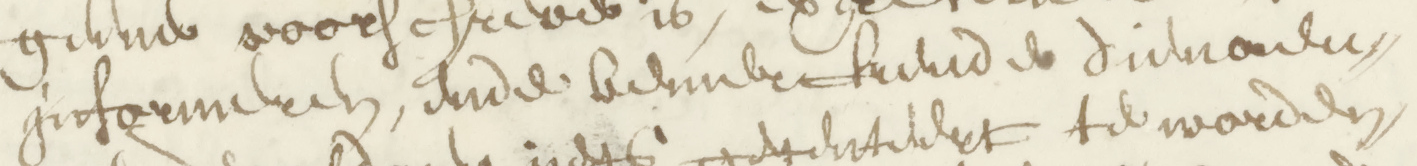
informeren, ende bemerckende dienaen„
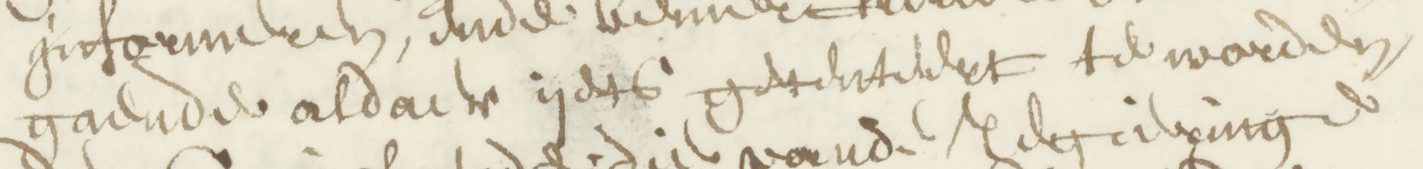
gaende aldaer ijets getenteert te worden,
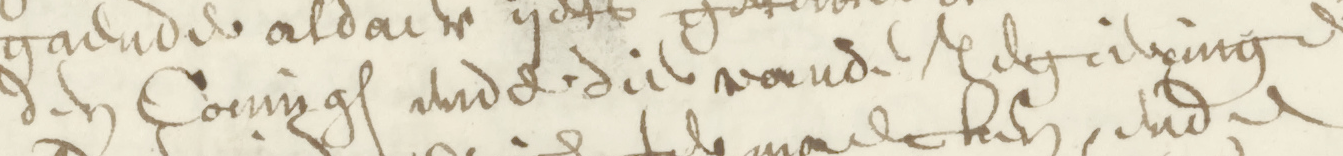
den Coningh ende die vande regieringe
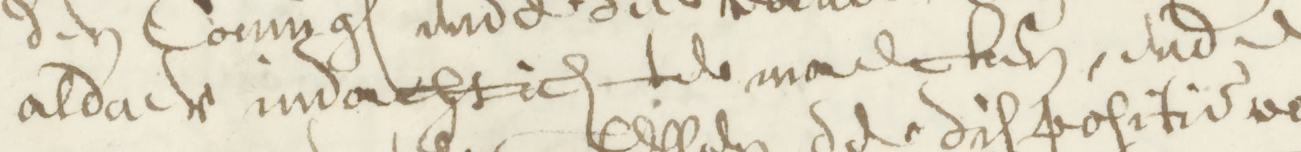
aldaer indachtich te maecken, ende
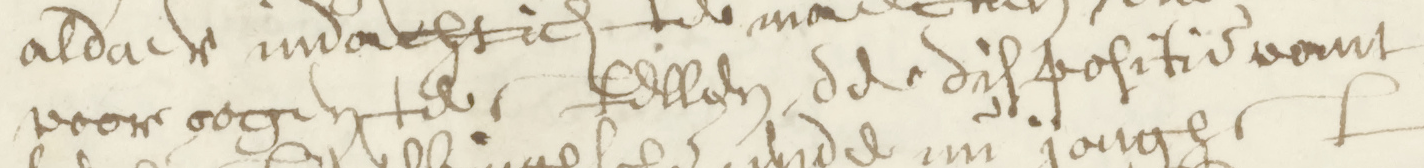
voor oogen te stellen de dispositie vant
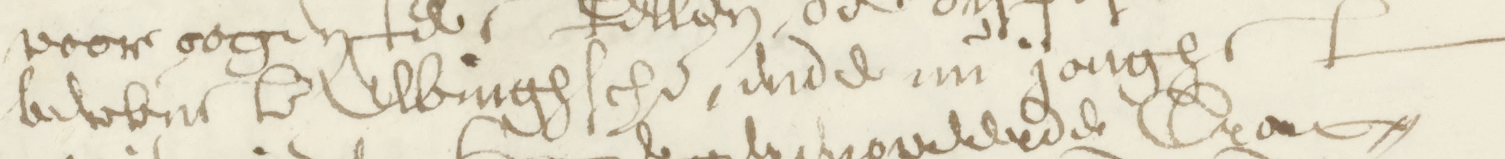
bewuste Elbinghsche, ende nu jonghst
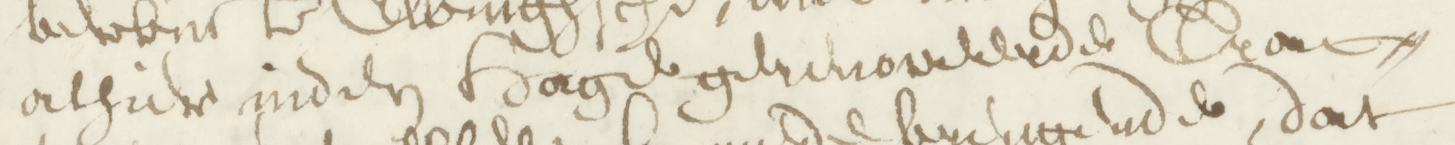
alhier inden Hage gerenoveerde Trac,,
